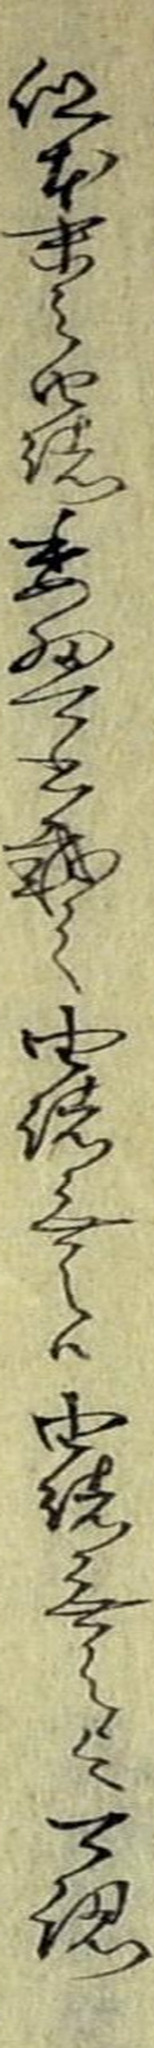但本末之由緒委細可書載之由緒無之ハ由緒無之与可認
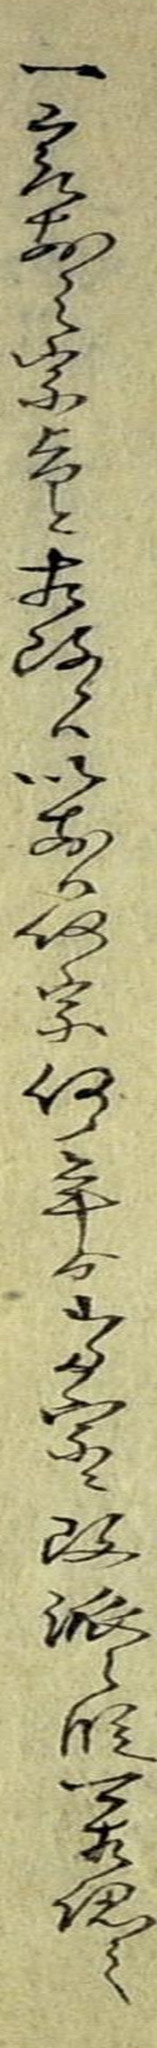一最前之宗旨ニ相改候ハ以前ハ何宗何年ゟ当宗ニ改派之段可相認之
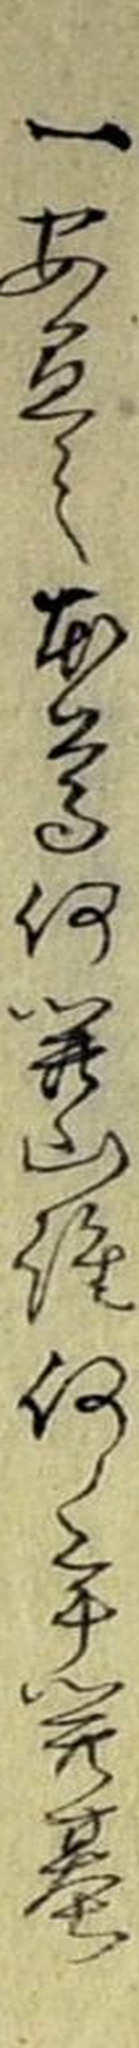一安置之本尊何開山誰何ノ年開基
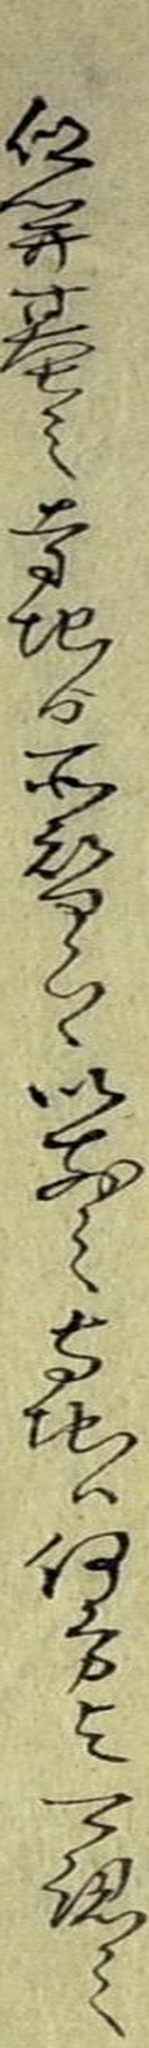但開基之寺地ゟ所替候ハヽ以前之寺地ハ何方与可認之
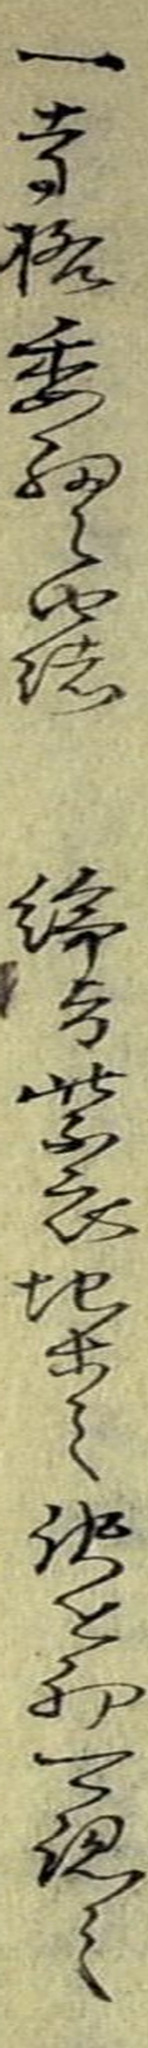一寺格委細之由緒綸旨紫衣地等之訳を初可認之
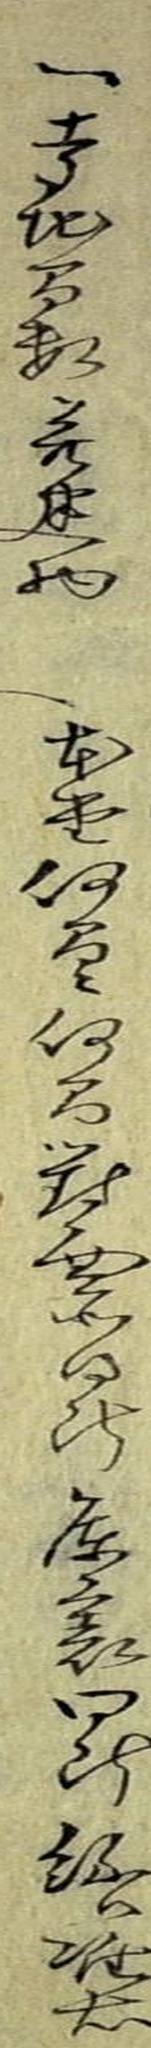一寺地間数并建物本堂何間ニ何間対面所同断庫裏同断縁ハ准右
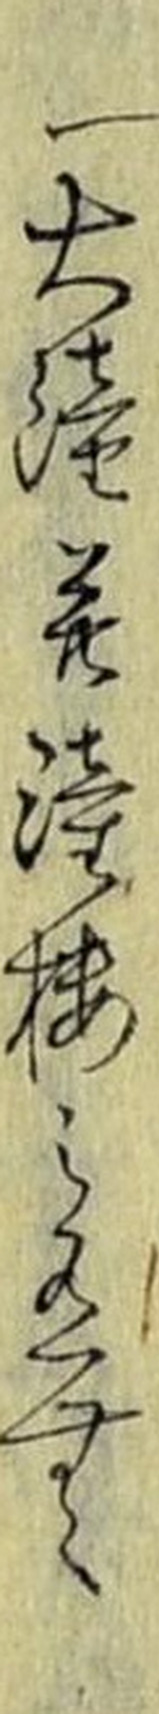大鐘并鐘楼之有無
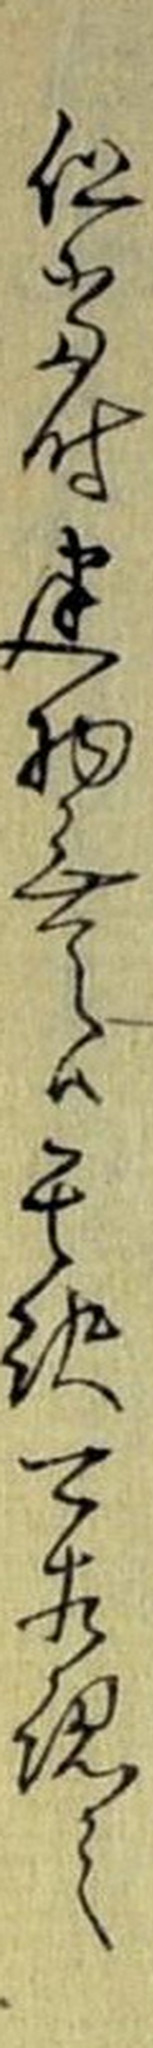但当時建物無之ハ其訳可相認之
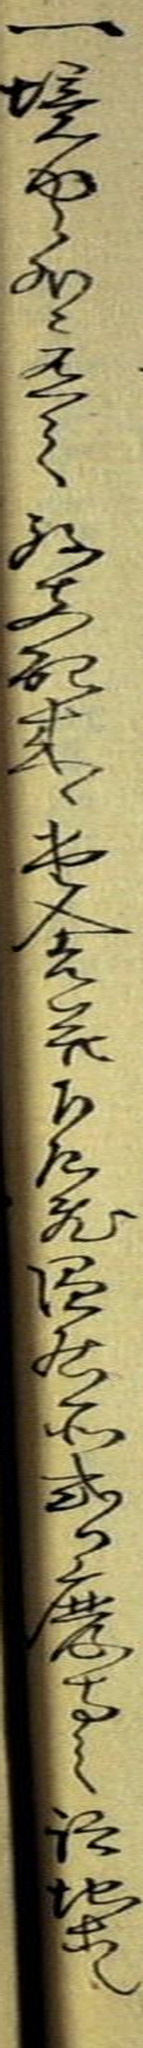一境内之外ニ有之致支配来候堂舎并下屋敷隠居所或ハ廃寺之跡地等之
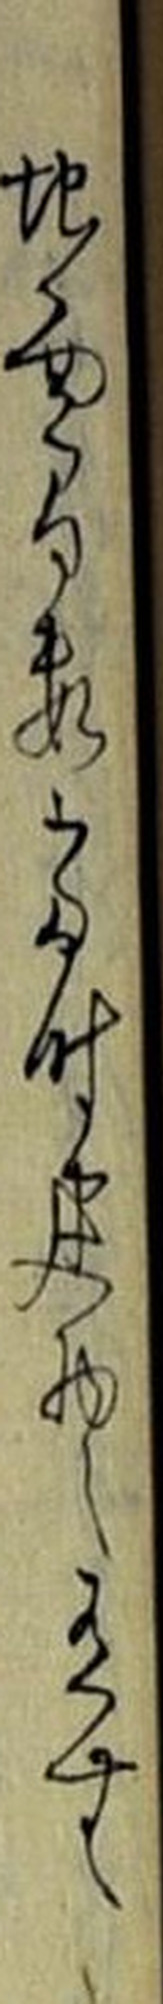地面間数当時建物之有無
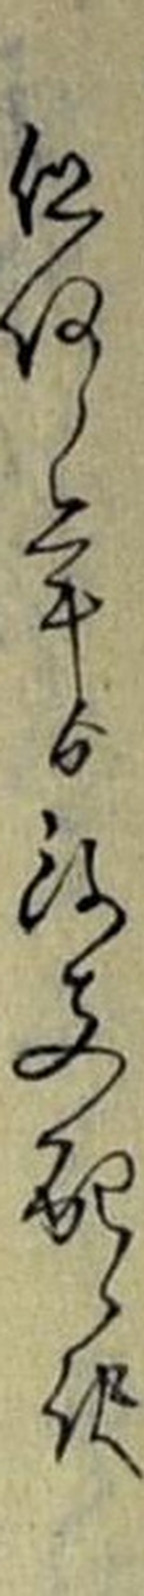但何ノ年ゟ致支配候訳
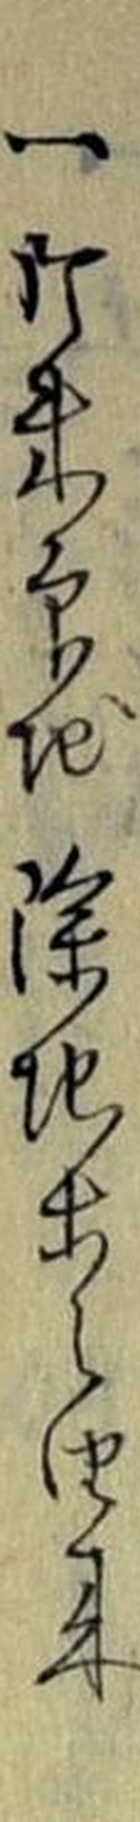一御朱印地除地等之由来
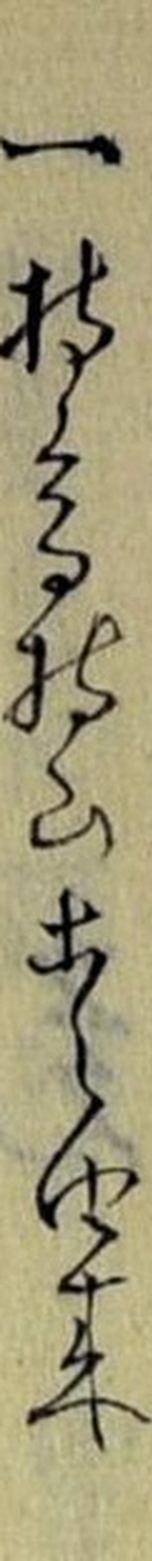一持高持山等之由来
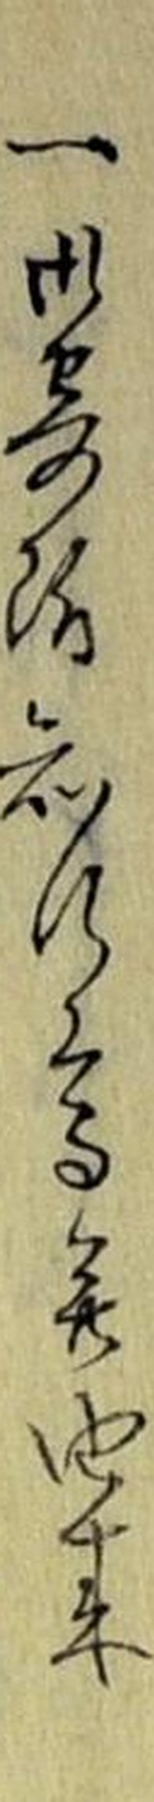一御寄附知行高并由来
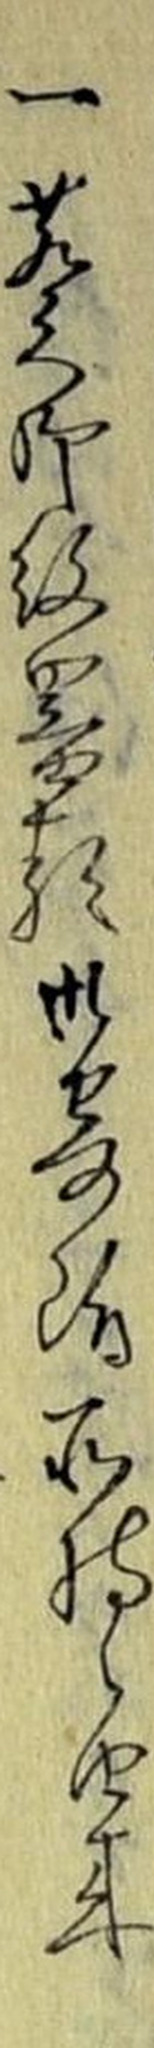一葵御紋冪類御寄附所持之由来
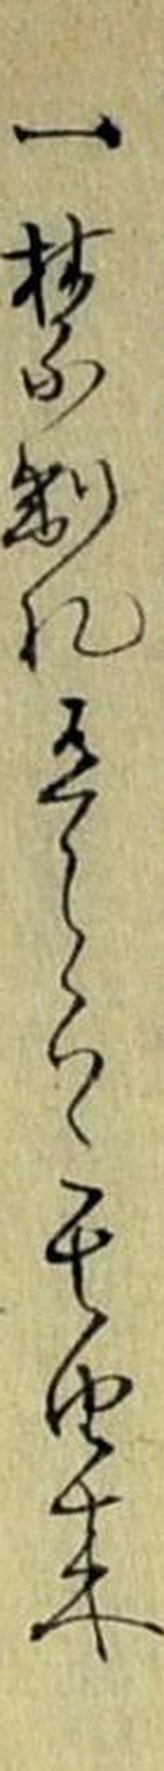一禁制札有之候ハヽ其由来
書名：命令之部 五
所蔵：福井県文書館 Fukui Prefectural Archives
